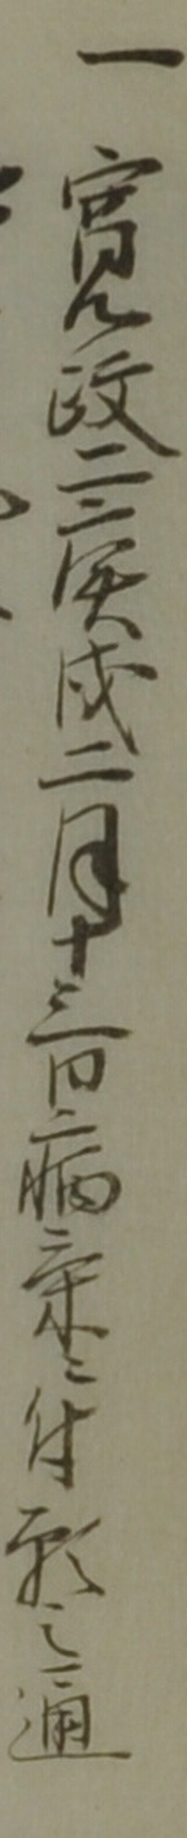一寛政二庚戌二月十三日病気ニ付願之通
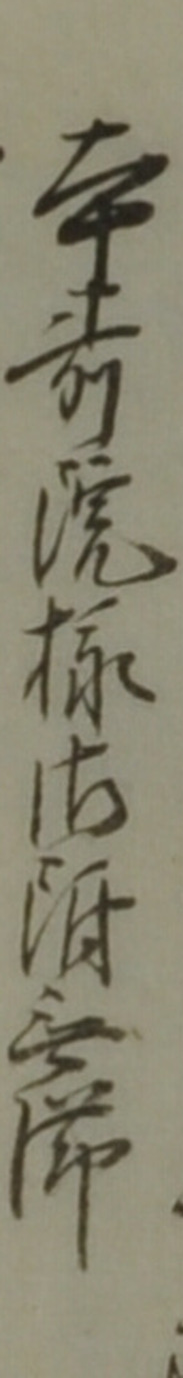本寿院様御附無滞
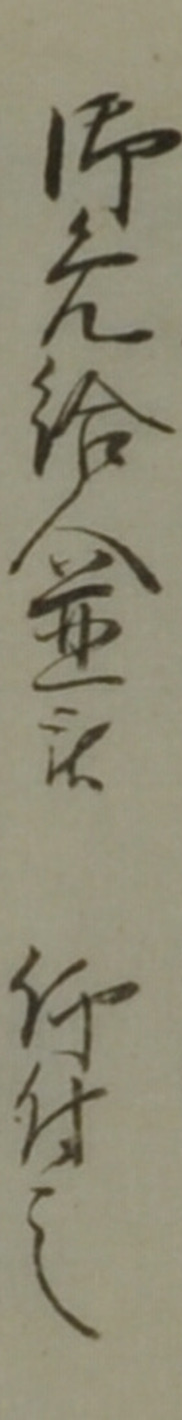御免給人並被仰付之
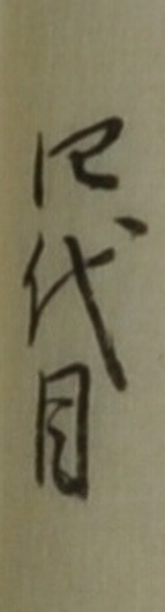四代目
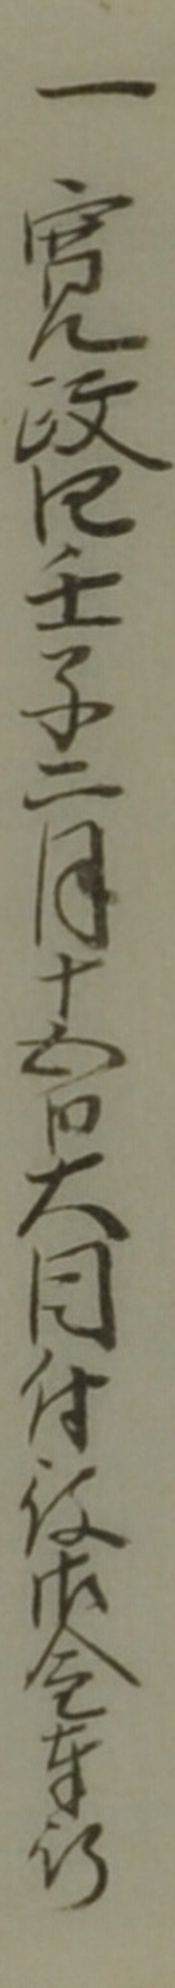一寛政四壬子二月十五日大目付役御金奉行
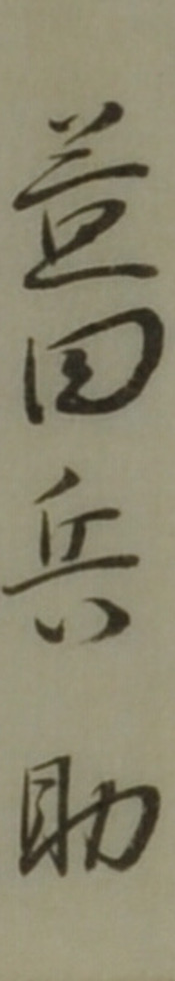益田兵助
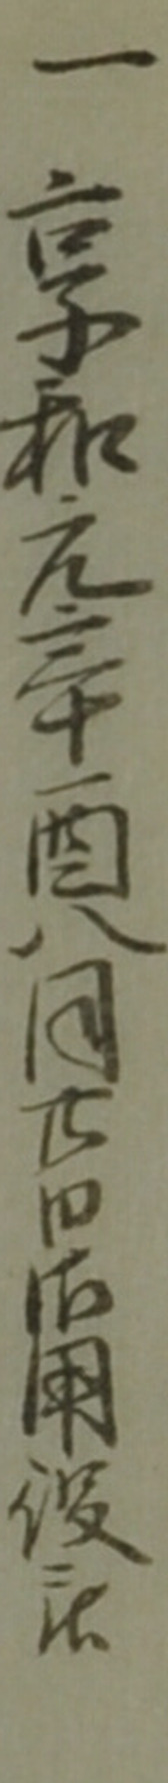一享和元辛酉八月廿日御用役被
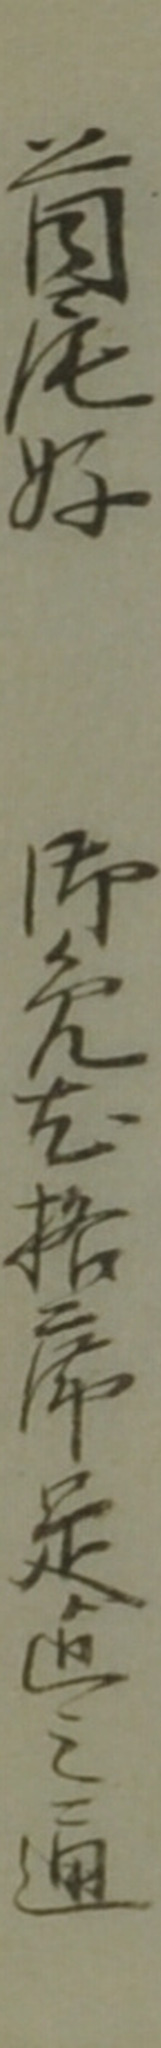首尾好御免尤格席是迄之通
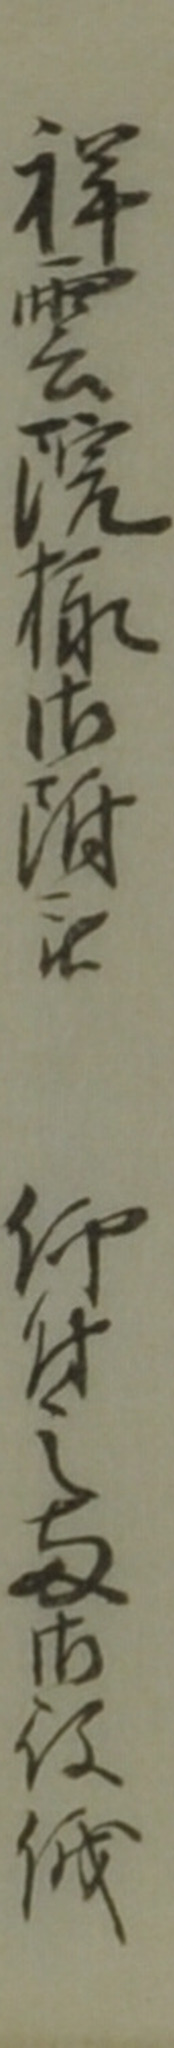祥雲院様御附被仰付之両御役儀
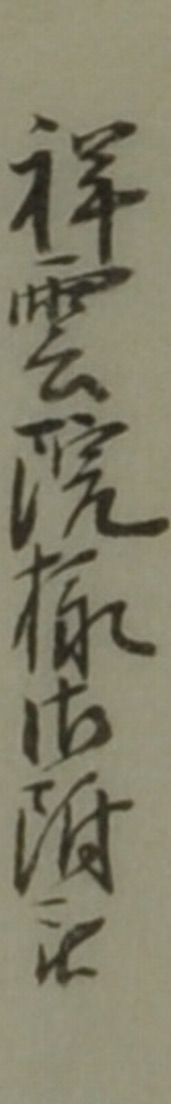祥雲院様御附御免
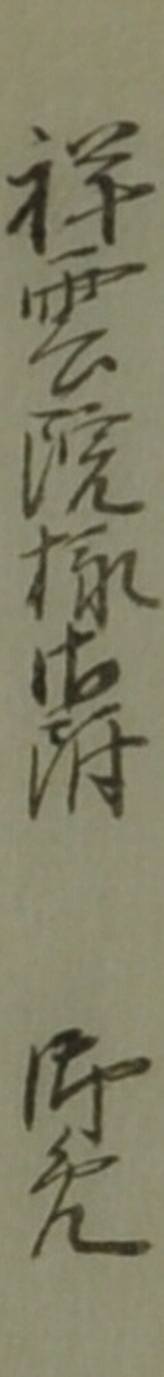祥雲院様御附御免
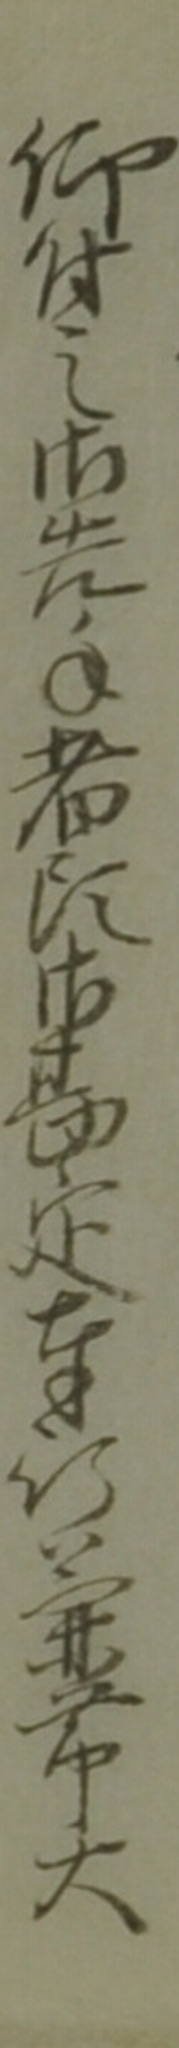仰付之御先手者頭御勘定奉行兼帯大
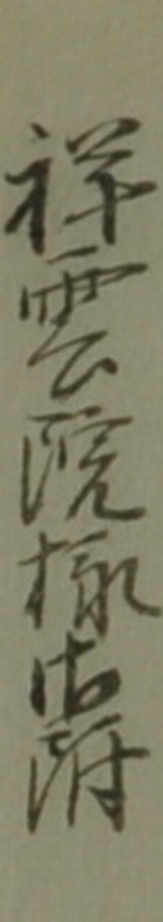祥雲院様御附御免
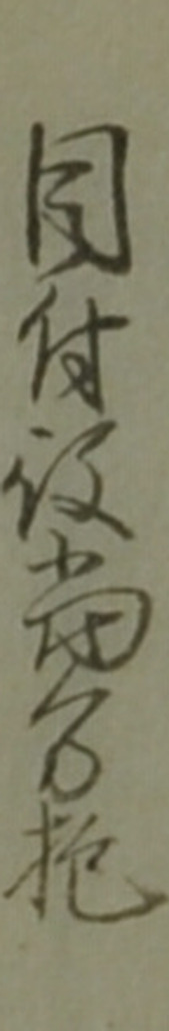目付役当分抱
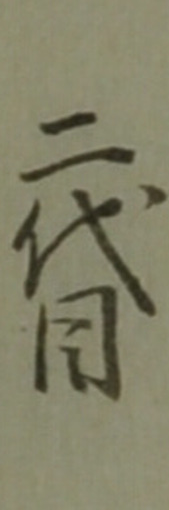二代目
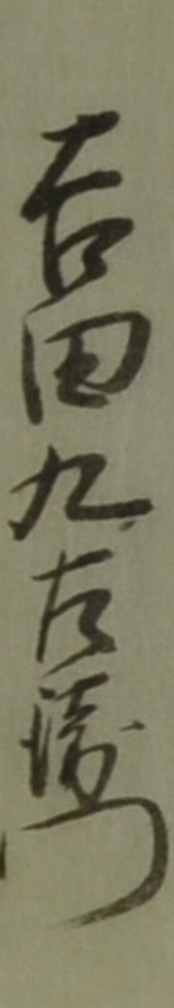吉田九左衛門
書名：諸御役代々録（六）
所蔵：伊那市立高遠町図書館・合同会社AMANE
